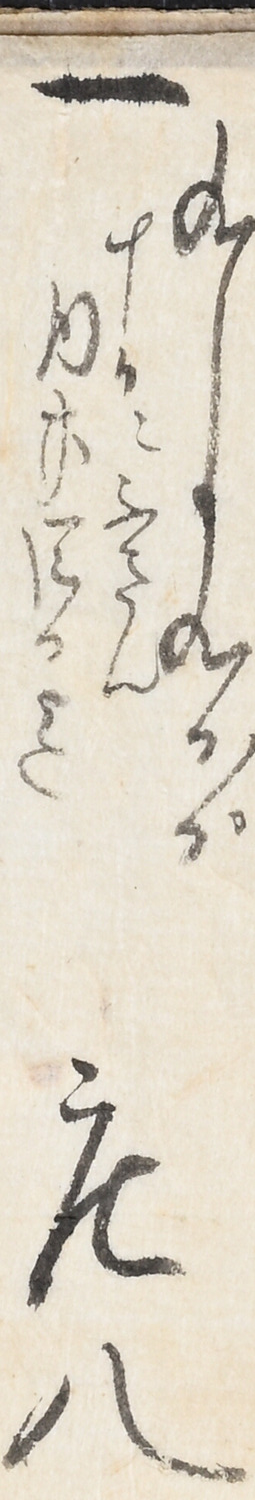同廿四日迄庄八
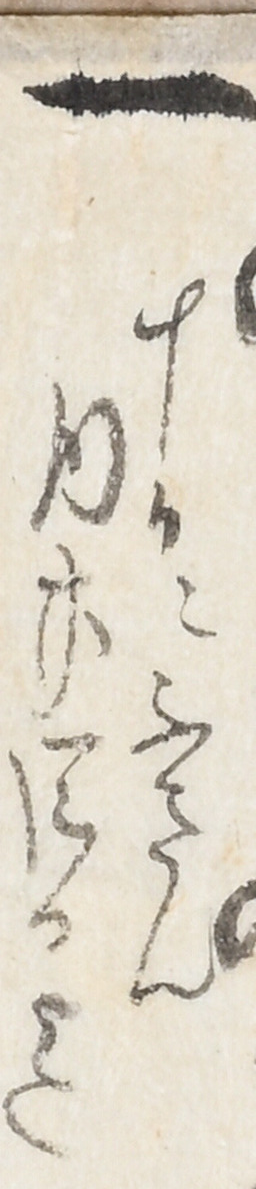同廿四日迄
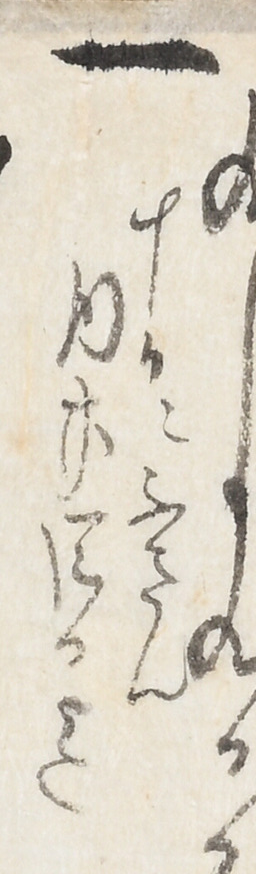同廿四日迄
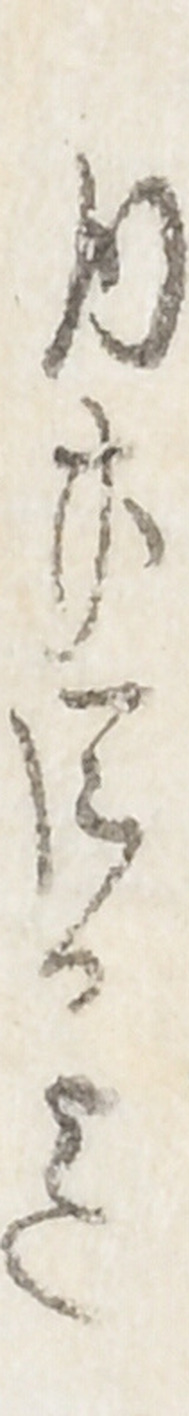同廿四日迄
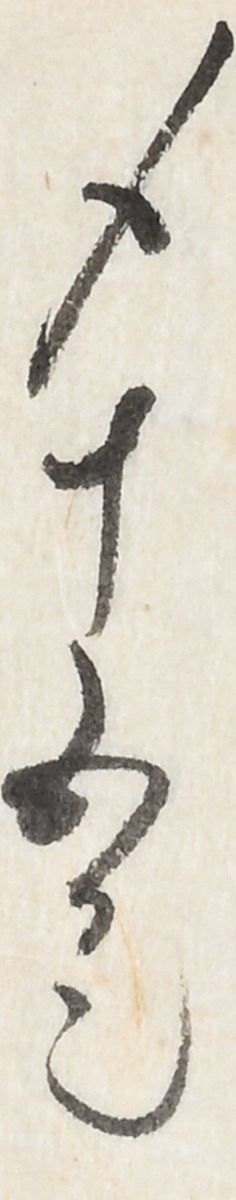〆十五日也
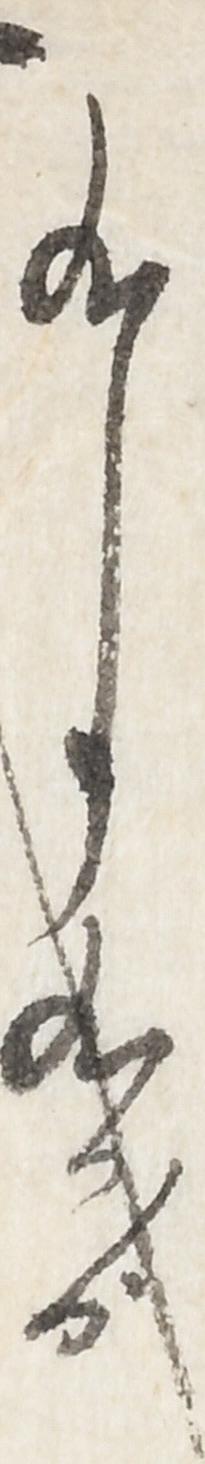九月九日ゟ

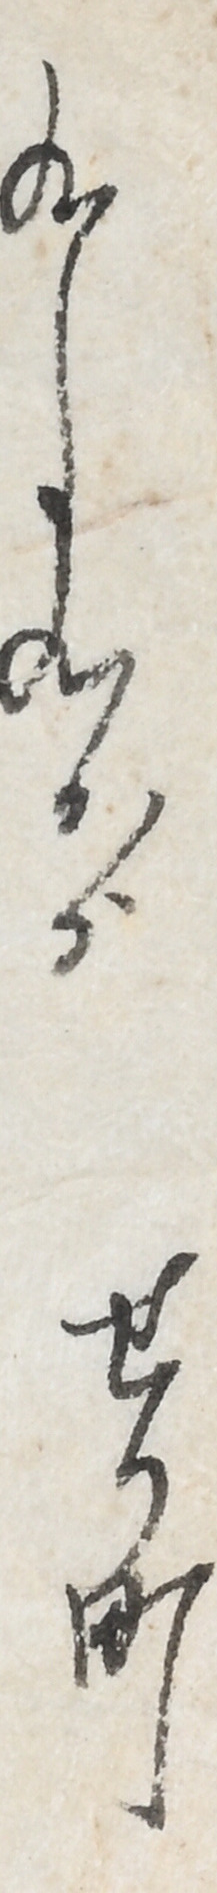九月九日ゟせり町
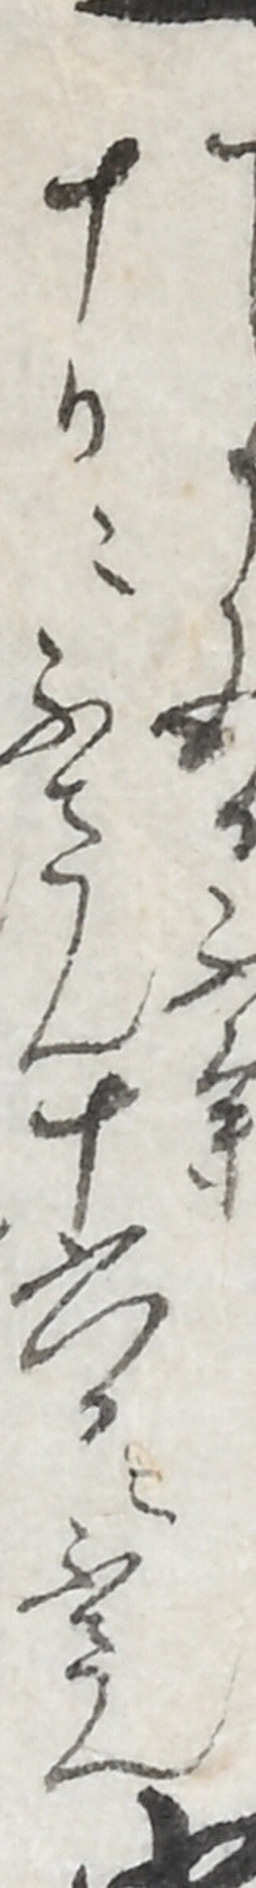十日ニふさん十六日ニふさん
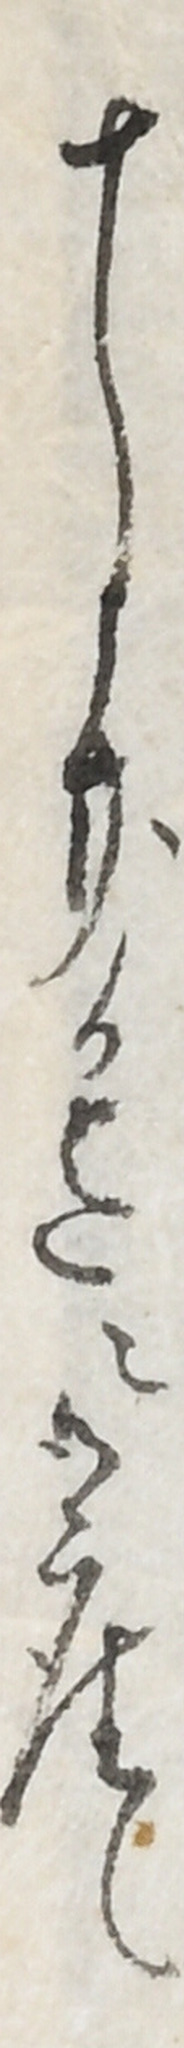十月廿日迄ニ御座候
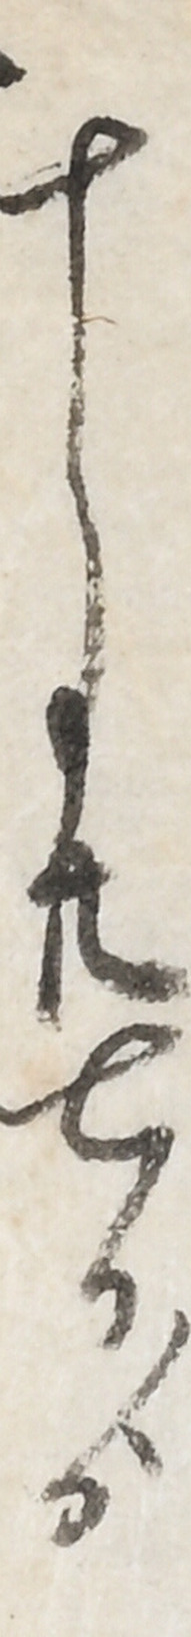十月廿七日ゟ
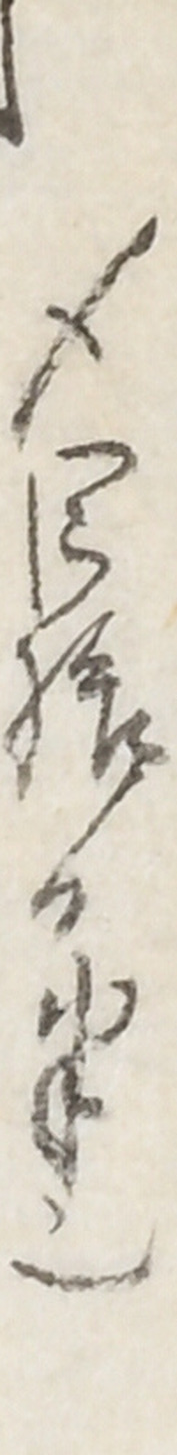〆四拾四日
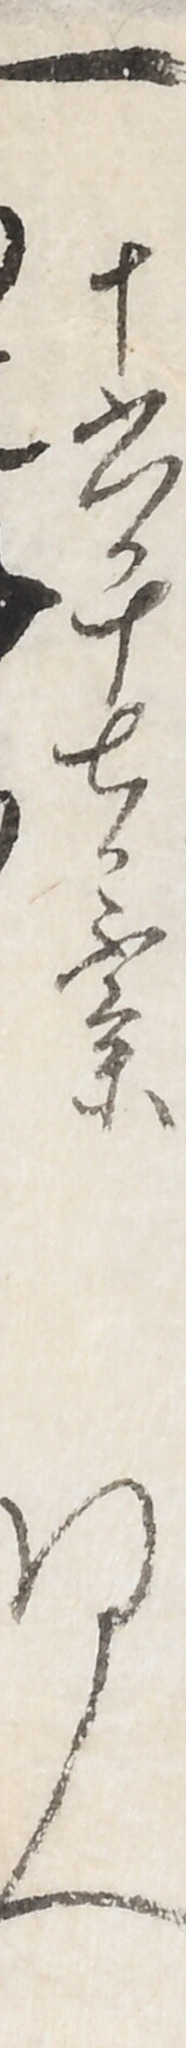一十六日十七日ふ参同人
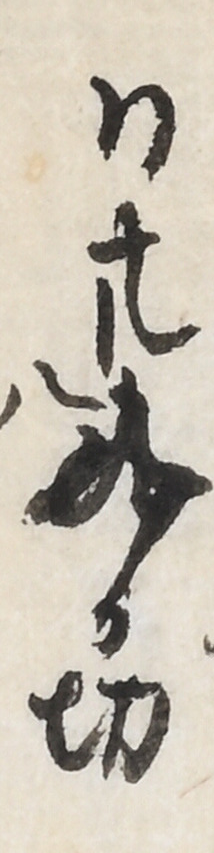同廿八日切
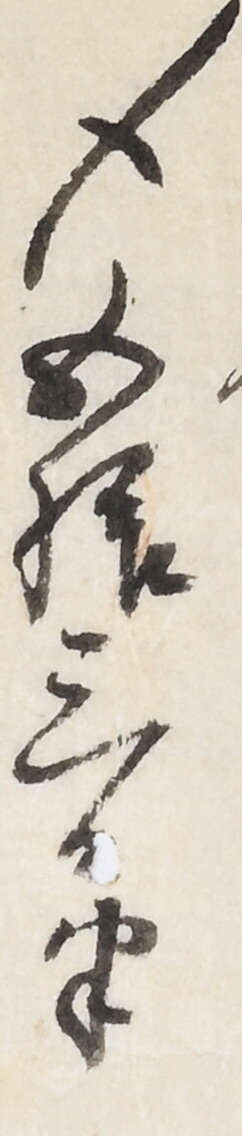〆五拾三日半
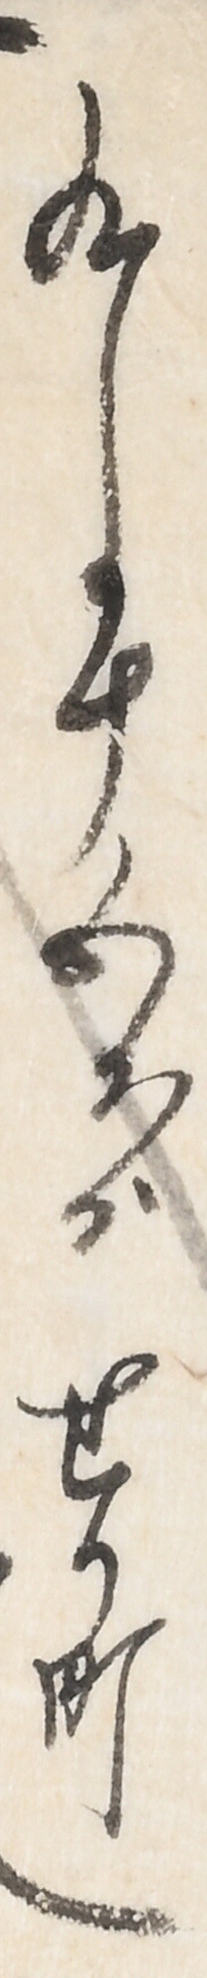九月十五日ゟせり町
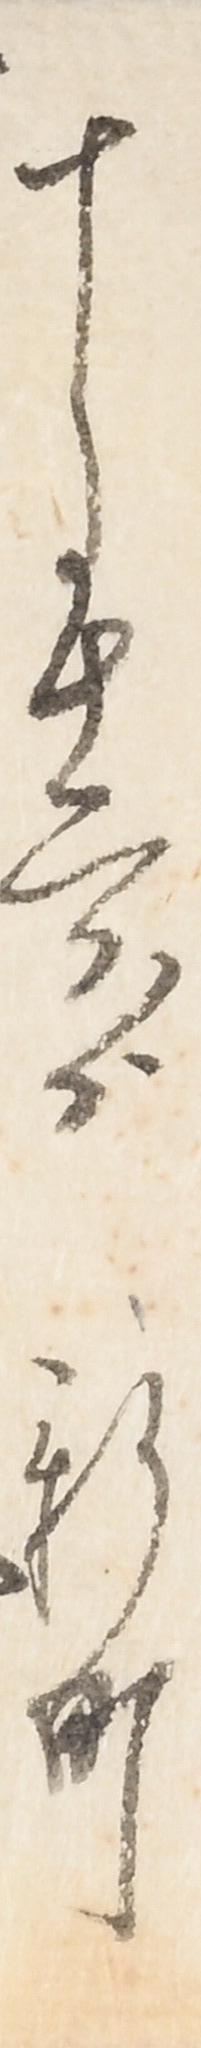十月十二日ゟ新町
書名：合力覚帳
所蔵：伊那市立高遠町図書館・合同会社AMANE
